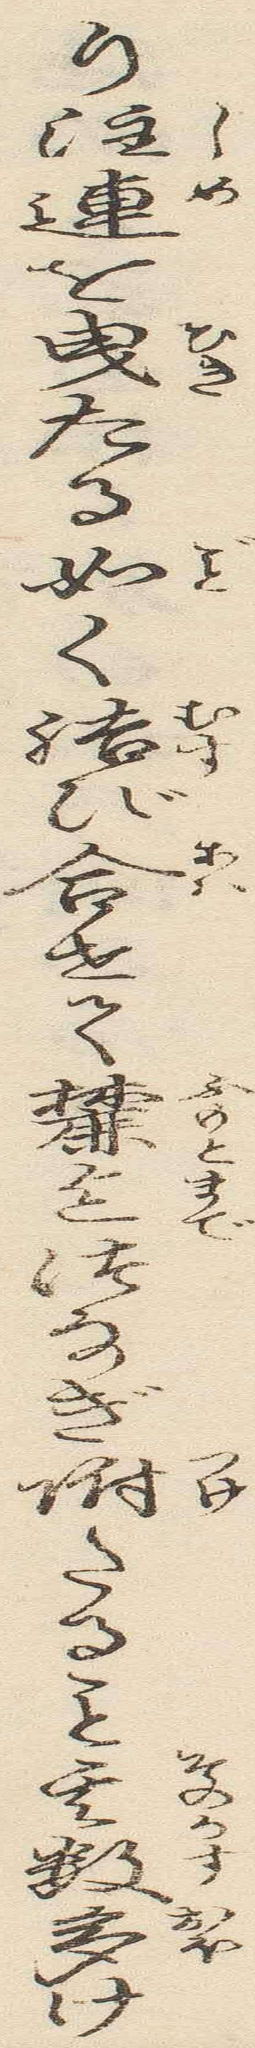り注連を曳たる如く結び合せて麓迄つなぎ附たること其数多け
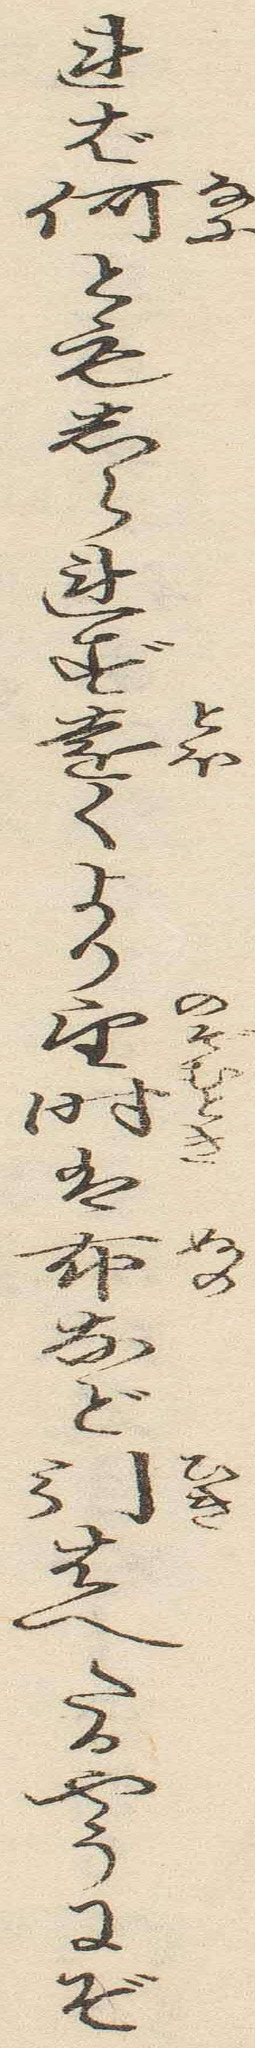れば何ともしられず遠くより望时は布など引はへたるやうにぞ
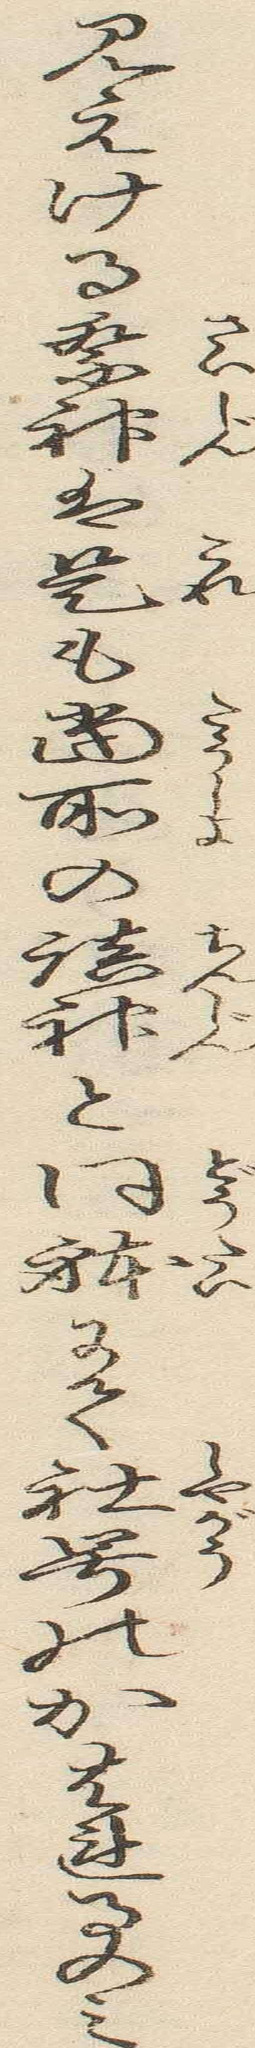見えける祭神は是も當所の鎮神と同躰にて社号のかはれるのみ
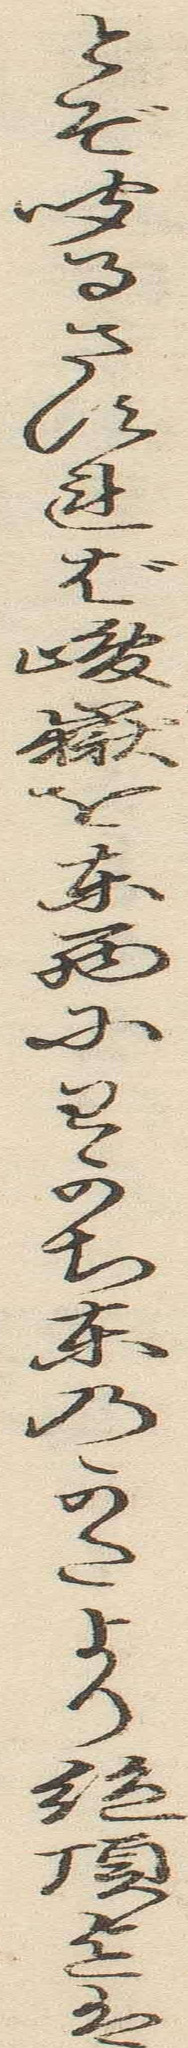とぞ聞るさすれば峻嶽を東西にわかち東のかたより絶頂迄は
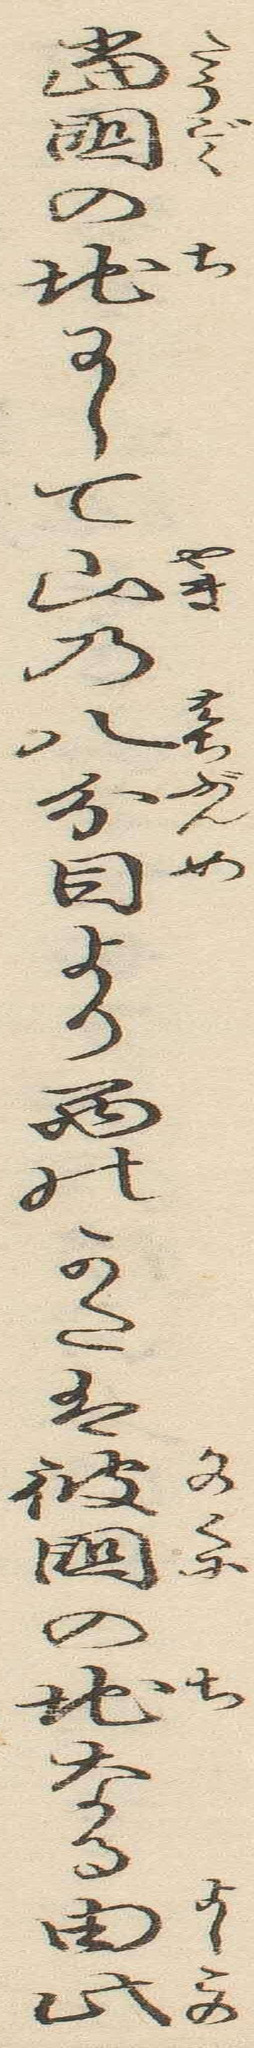當國の地にして山の八分目より西のかたは彼國の地なる由此
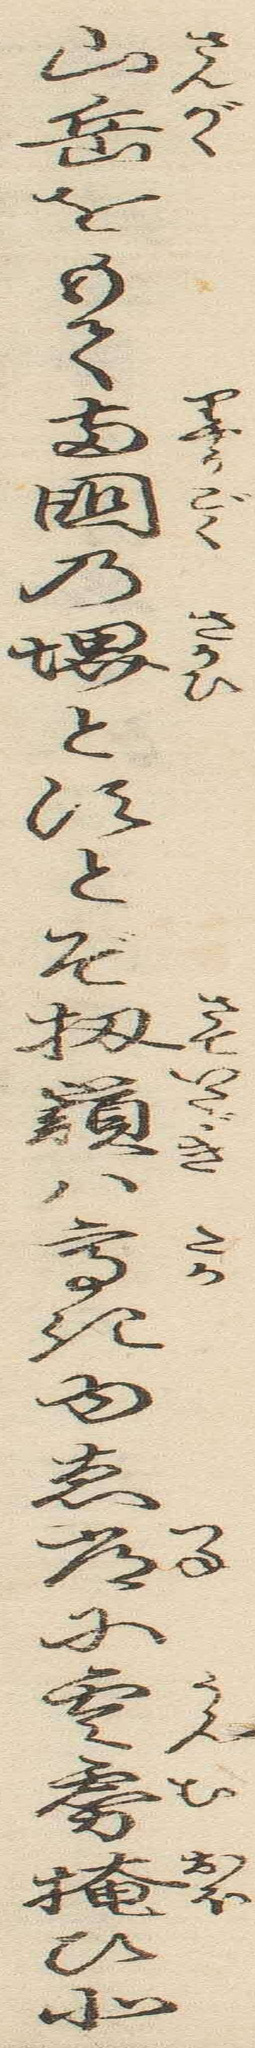山岳をもて両国の堺とすとぞ扨巔は高きゆゑ常に雲霧掩ひ北
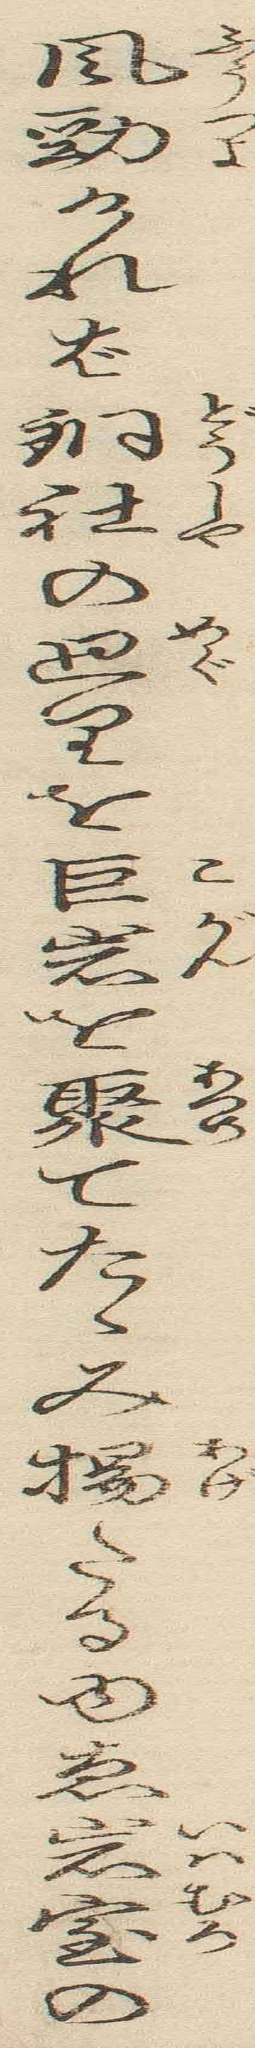風勁ければ銅社の廻りを巨岩を聚てたゝみ揚たるゆゑ岩室の
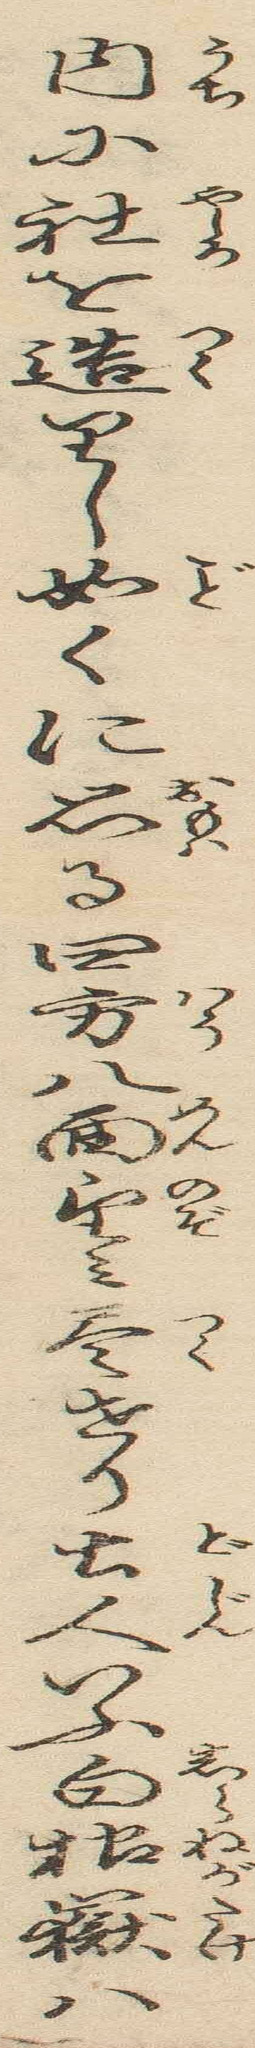内に社を造りし如くに思る四方八面望み尽せり土人いふ白根嶽は

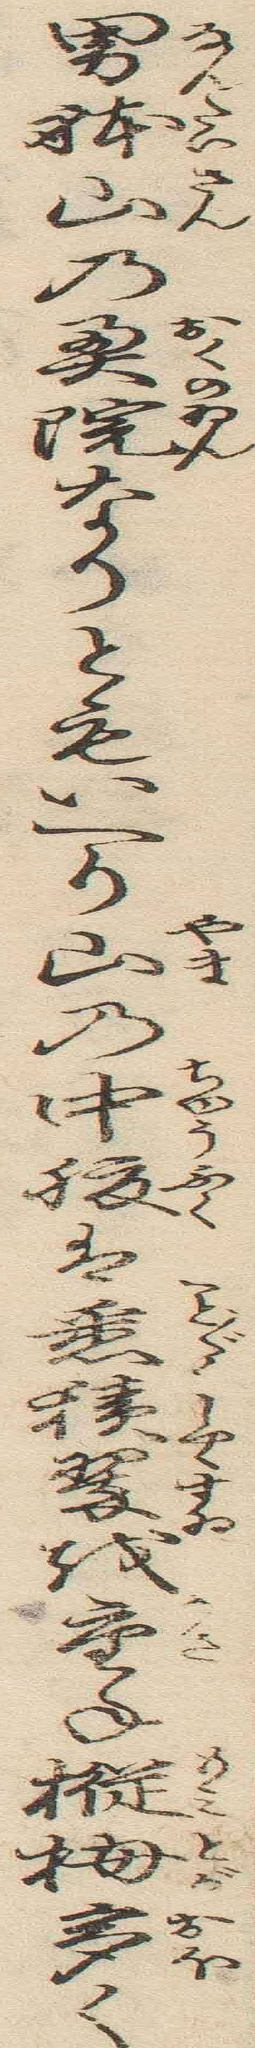男躰山の奥院なりともいへり山の中腹は悉積翠を重ね樅栂多く
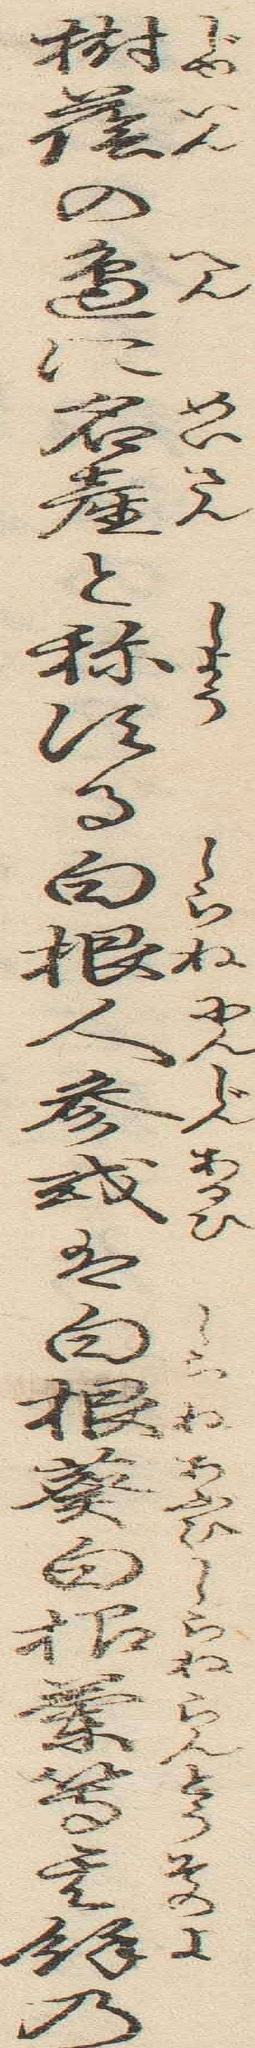樹蔭の邊に名產と称する白根人参或は白根葵白根蘭等其餘の
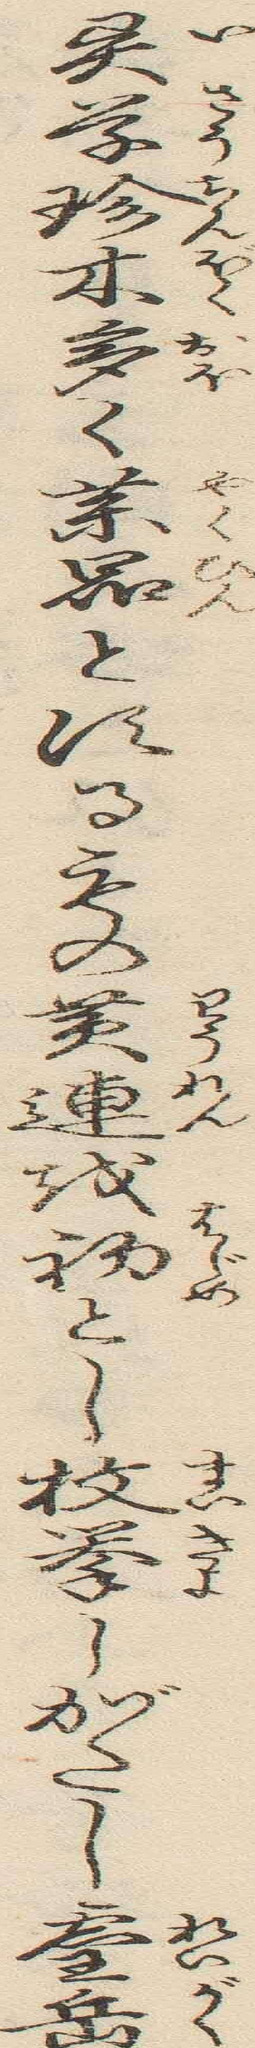異草珍木多く薬品とするもの黄連を初とし枚挙しがたし霊岳
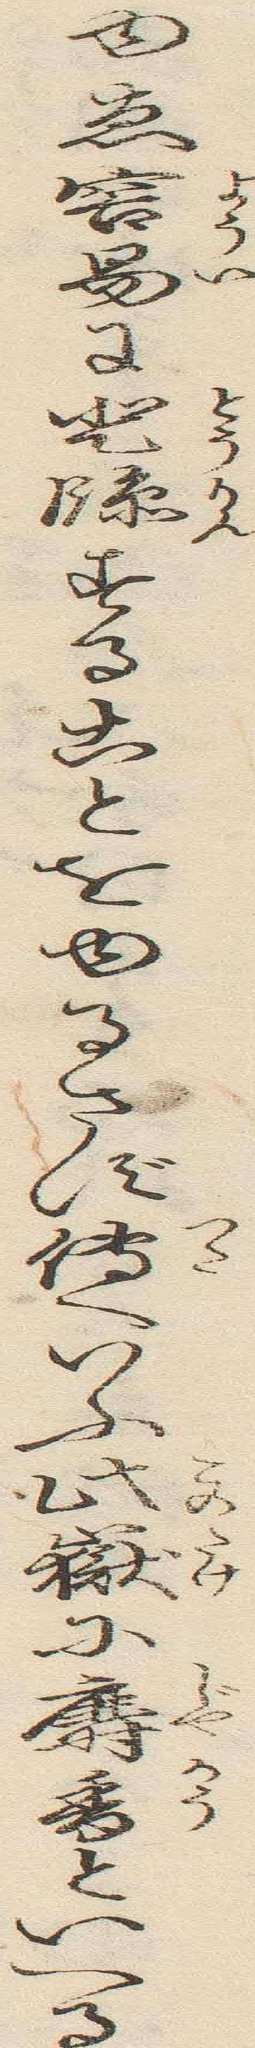ゆゑ容易に登臨することをゆるさず傳へいふ此嶽に麝香といへる
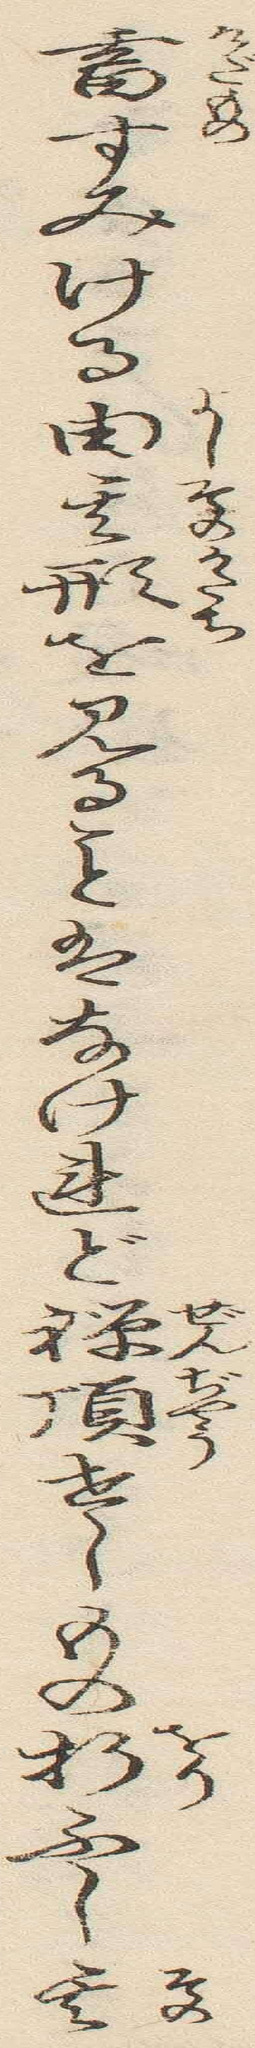畜すみける由其形を見ることはなけれど禅頂せしもの折ふし其
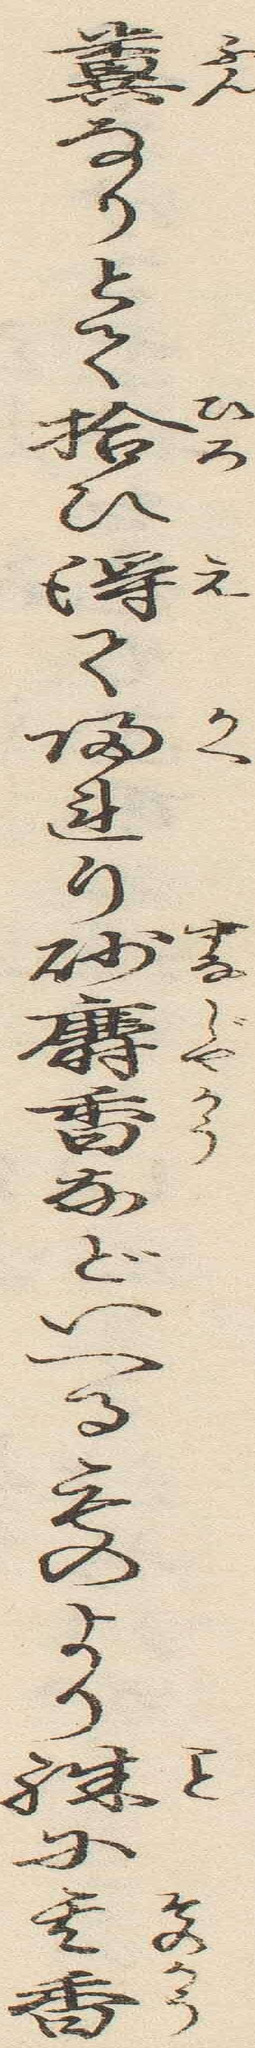糞なりとて拾ひ得て帰れり砂麝香などいへるものより殊に其香
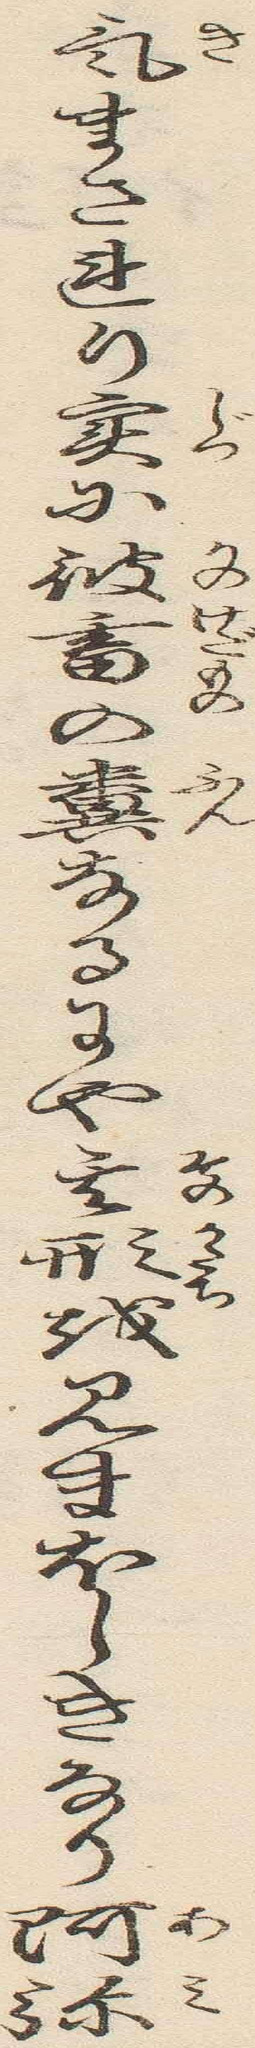気まされり実に彼畜の糞なるにや其形を見まほしきなり阿弥
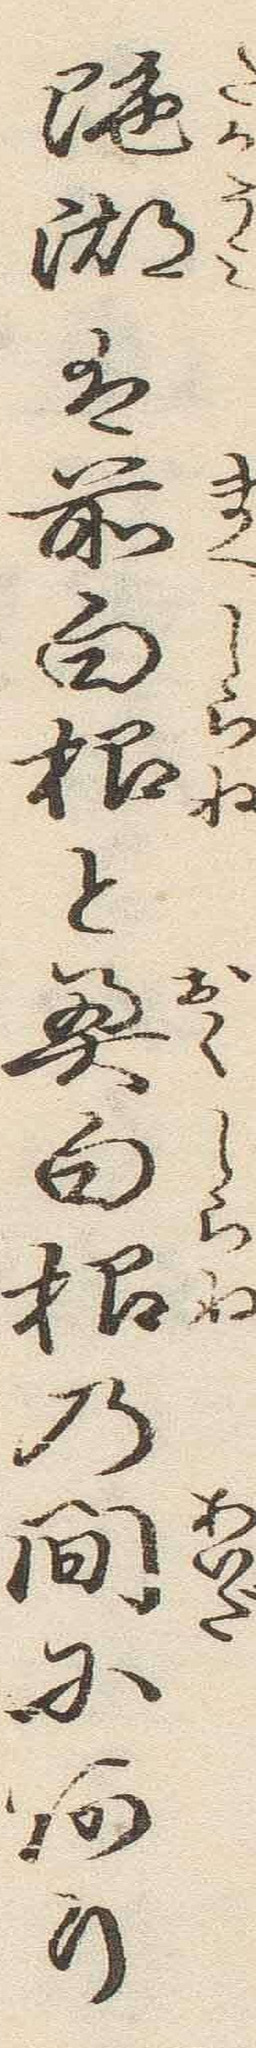陀湖は前白根と奥白根の間にあり
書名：日光山志
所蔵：東京学芸大学附属図書館 国文学研究資料館
